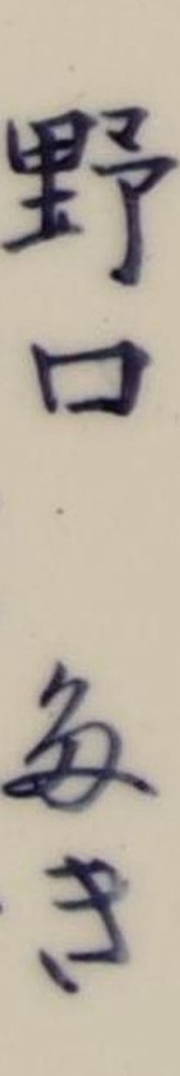野口たき
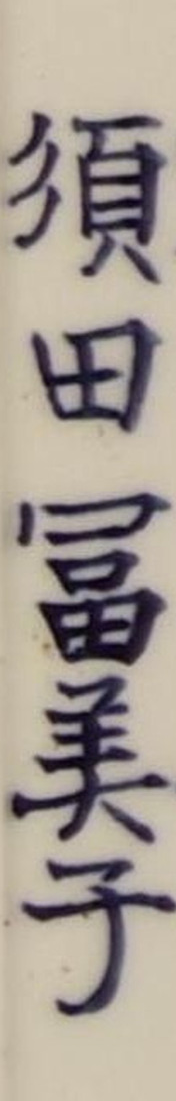須田冨美子

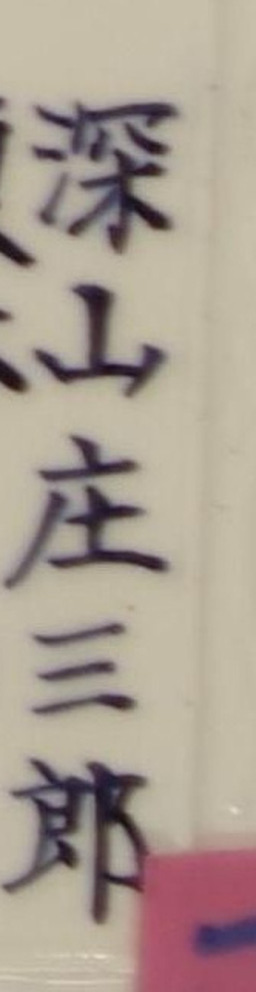深山庄三郎
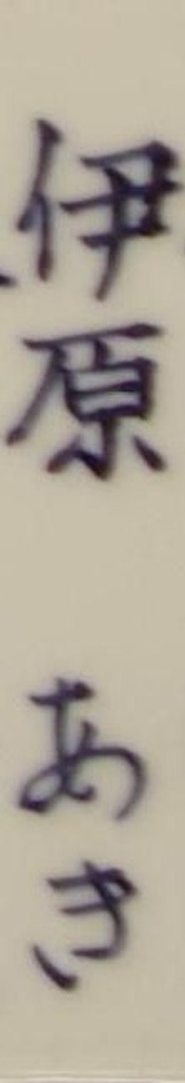伊原あき
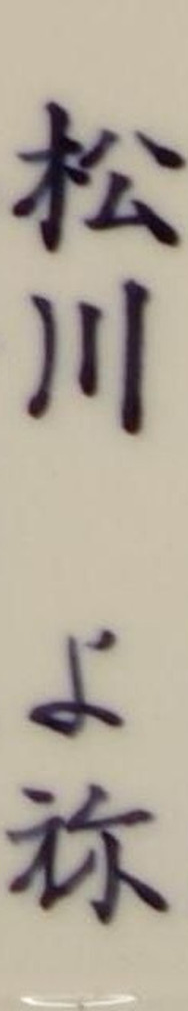松川よね
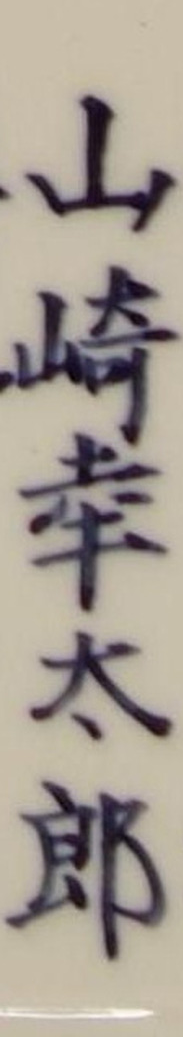山崎幸太郎
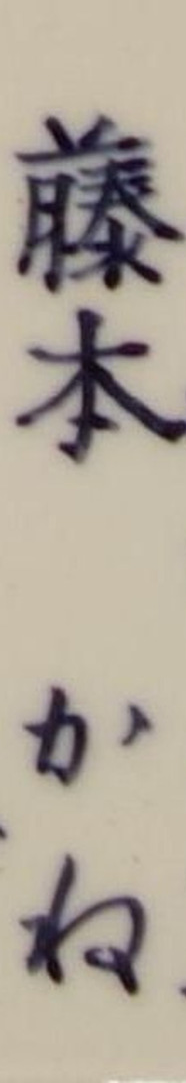藤本かね
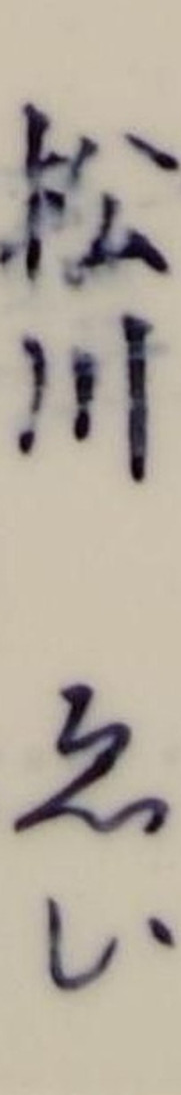松川えい
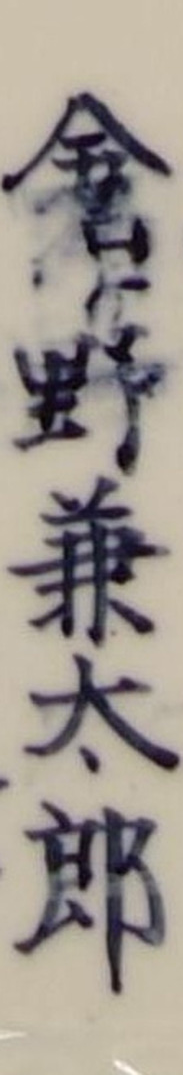倉ヶ野兼太郎
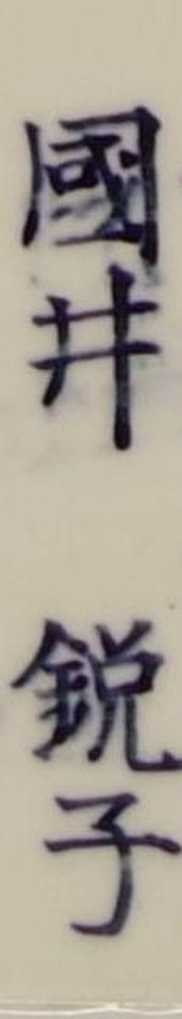國井鋭子
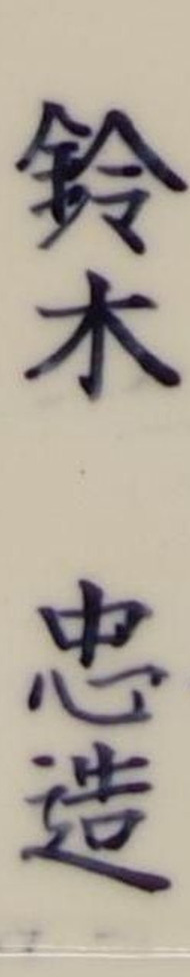鈴木忠造
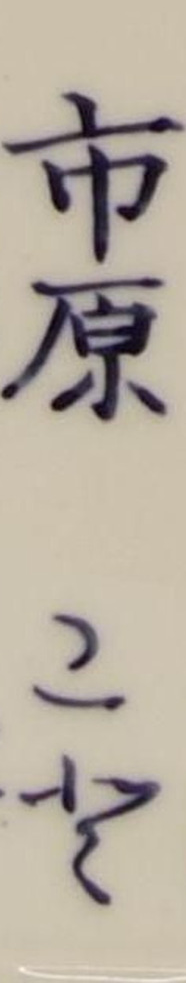市原こと
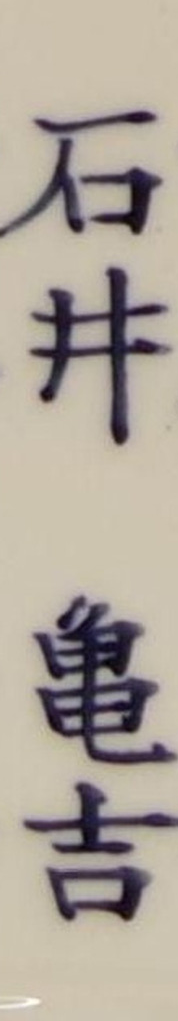石井亀吉
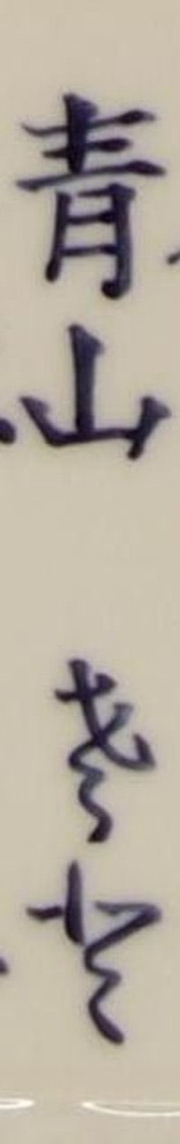青山さと
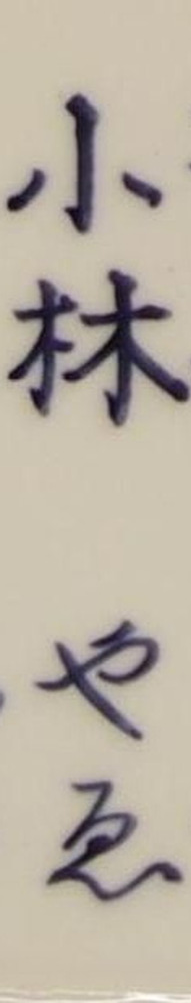小林やえ

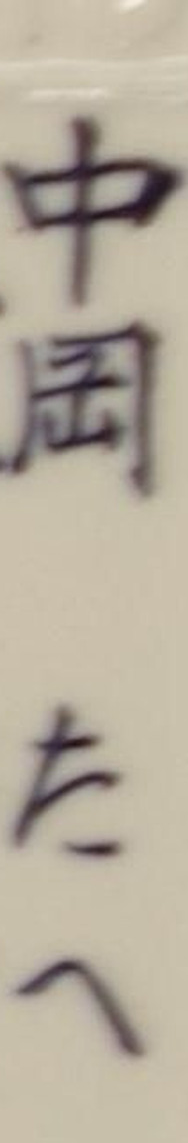中岡たへ
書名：M~S
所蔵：高野山金剛峯寺
